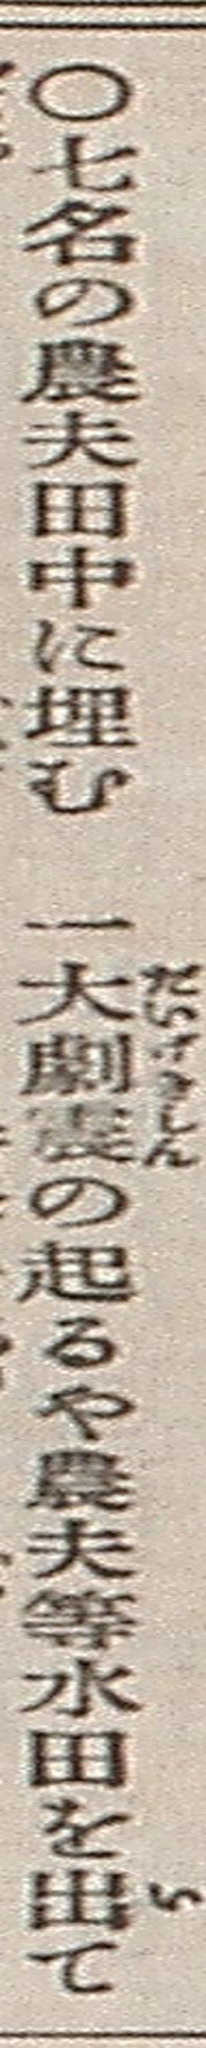〇七名の農夫田中に埋む一大激震の起るや農夫等水田を出て
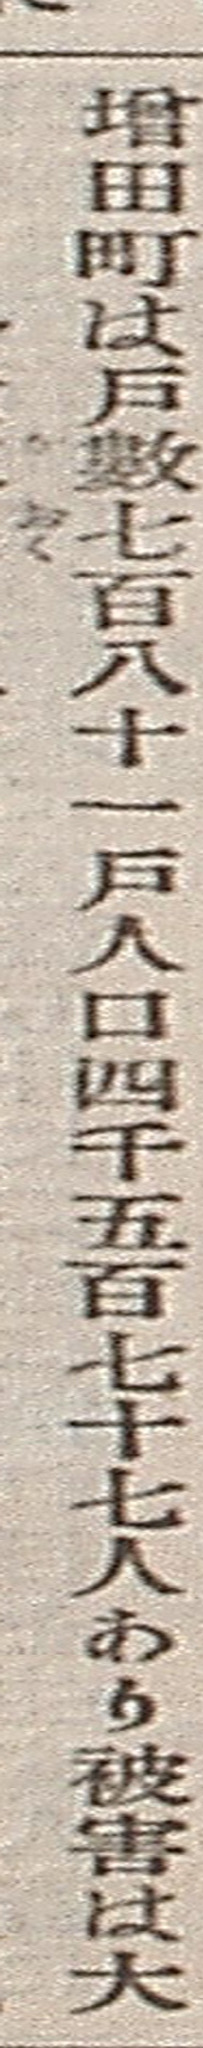増田町は戸数七百八十一戸人口四千五百七十七人あり被害は大
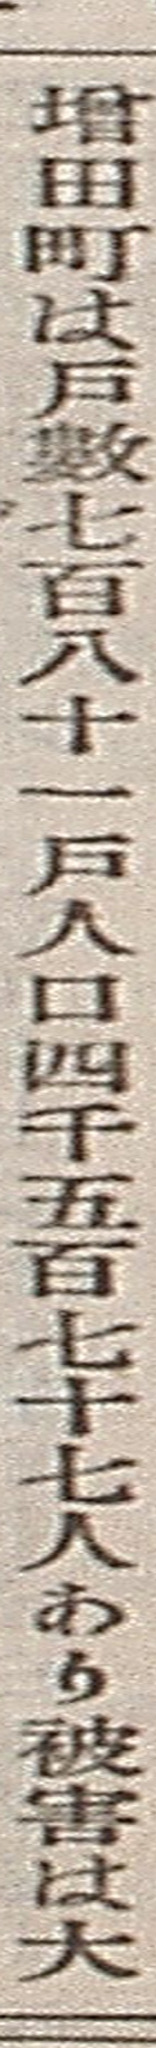増田町は戸数七百八十一戸人口四千五百七十七人あり被害は大
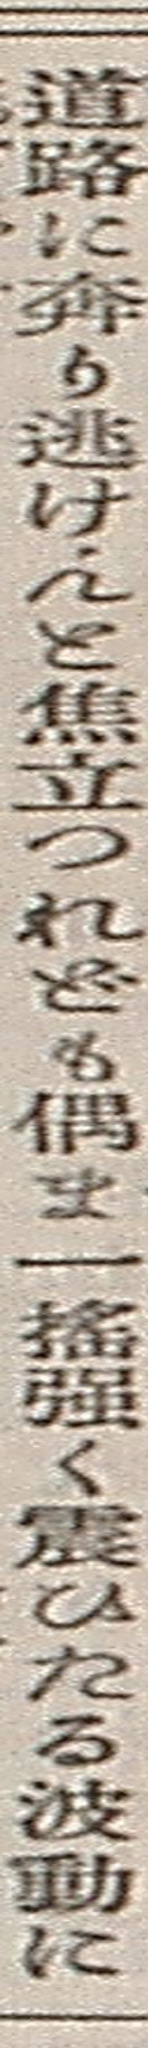道路に奔り逃けんと焦立つれども偶ま一揺強く震ひたる波動に
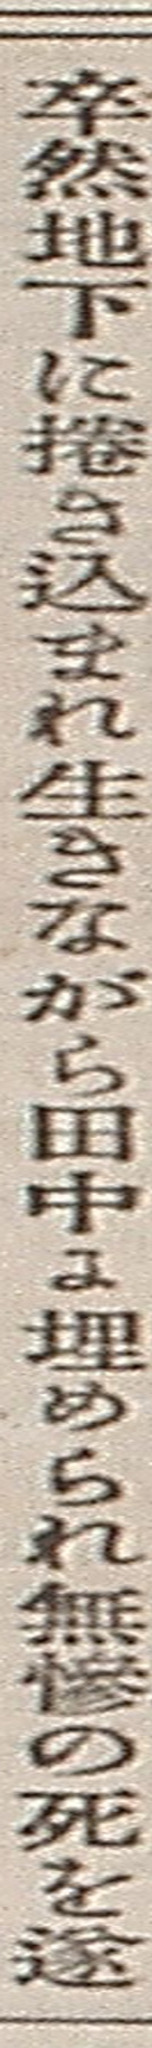卒然地下に捲き込まれ生きながら田中に埋められ無惨の死を遂
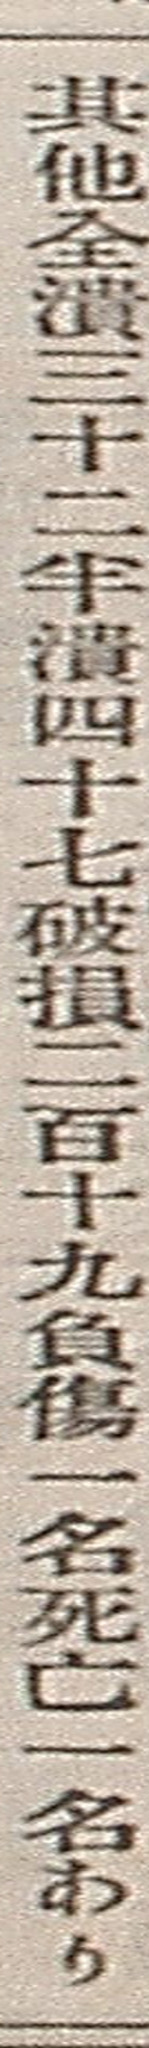其他全潰三十二半潰四十七破損二百十九負傷一名死亡一名あり
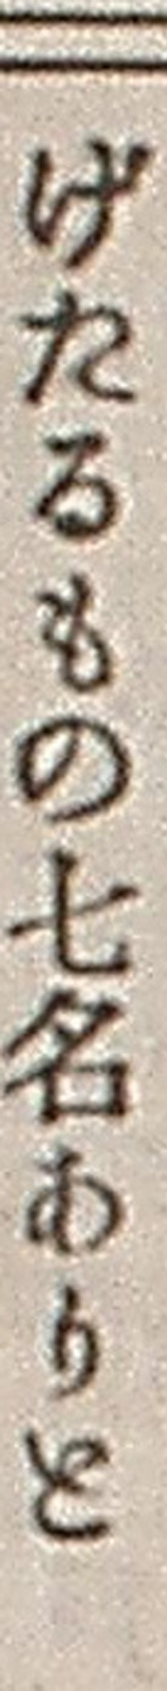げたるもの七名ありと
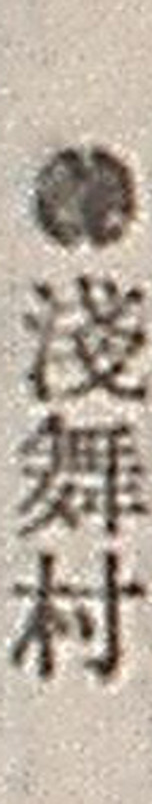●浅舞村
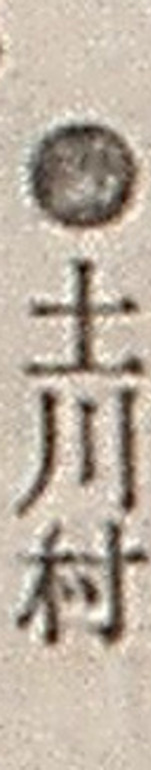●土川村
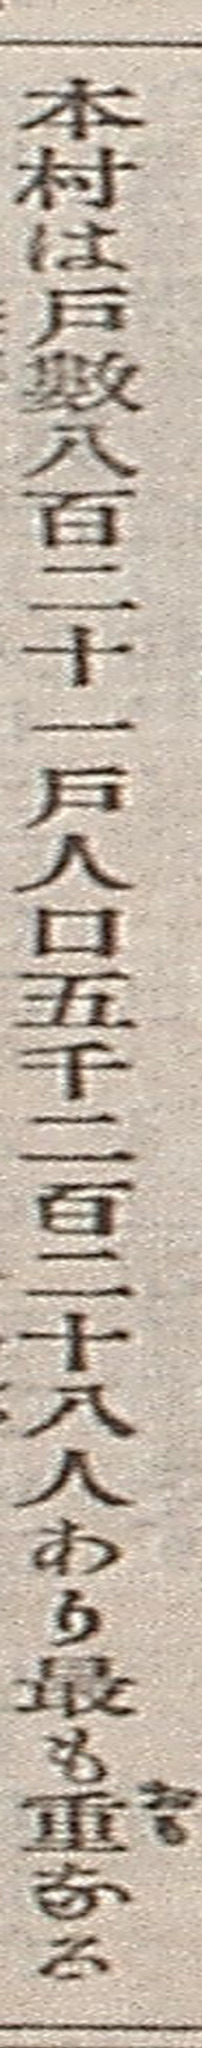本村は戸数八百二十一戸人口五千二百二十八人あり最も重なる
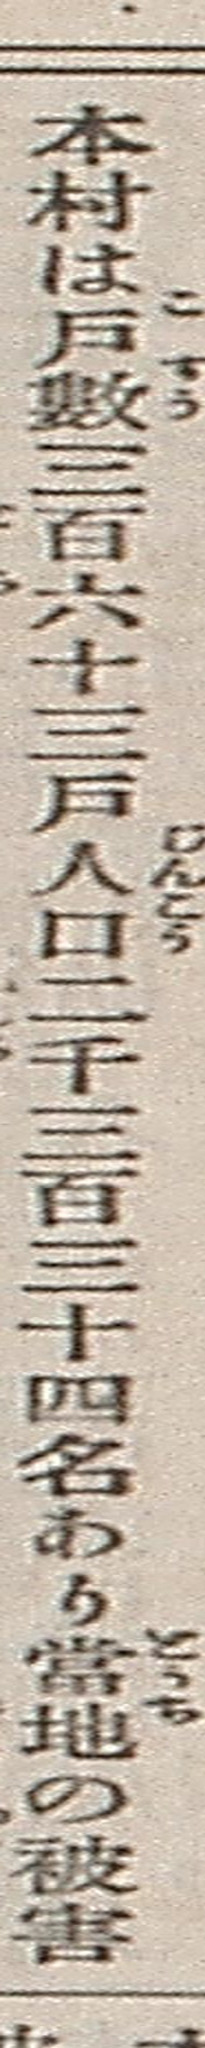本村は戸数三百六十三戸人口二千三百三十四名あり当地の被害
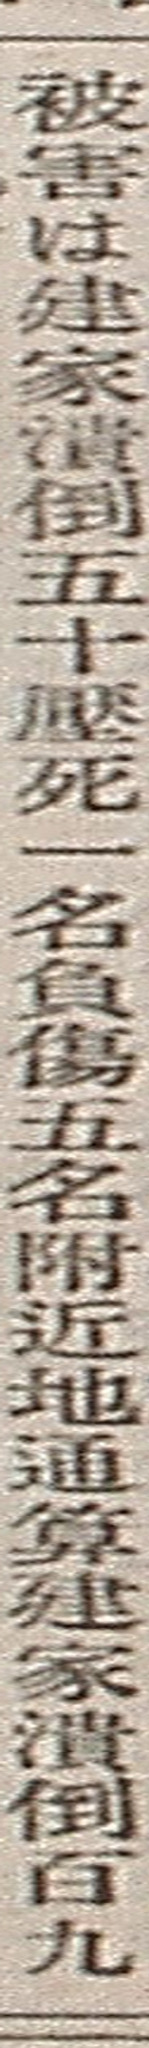被害は建家潰倒五十圧死一名負傷五名附近地通算建家潰倒百九
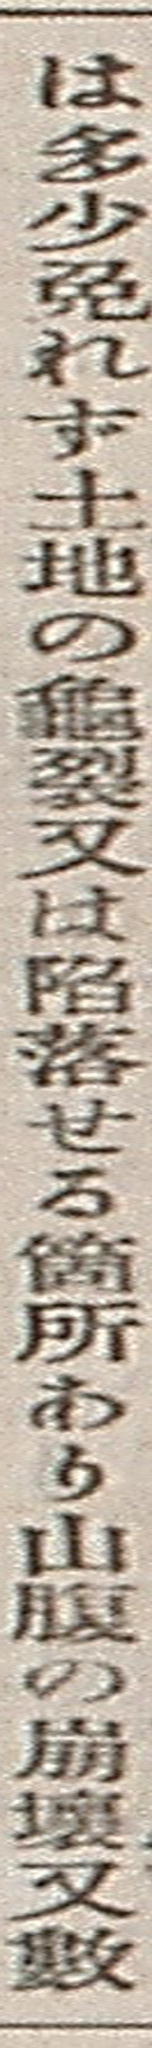は多少免れず土地の亀裂又は陥落せる箇所あり山腹の崩壊又数
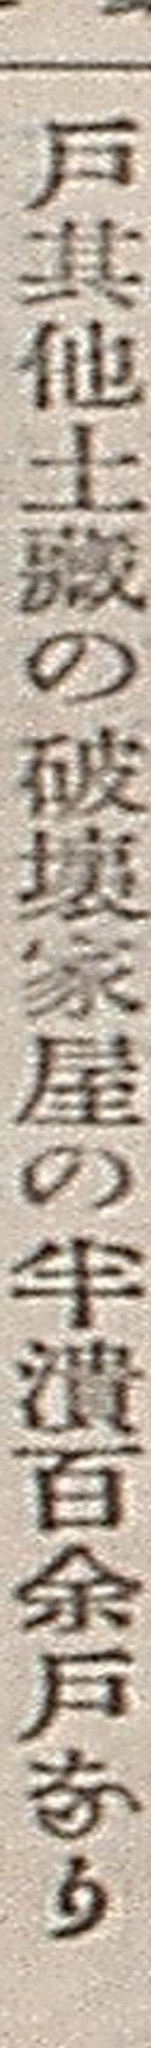戸其他土蔵の破壊家屋の半潰百余戸なり
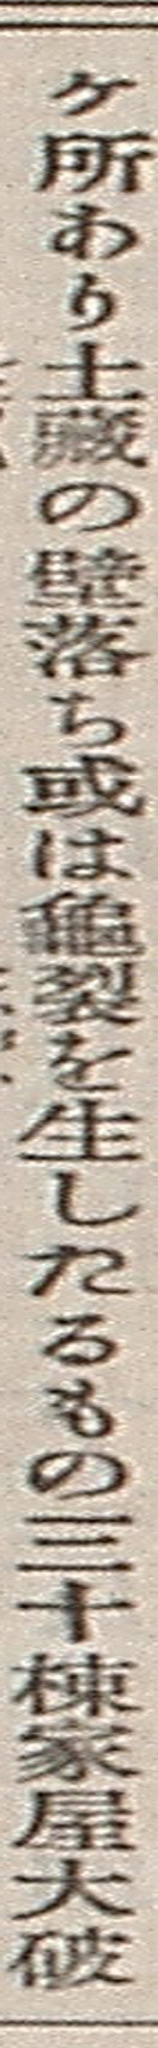ケ所あり土蔵の壁落ち或は亀裂を生したるもの三十棟家屋大破
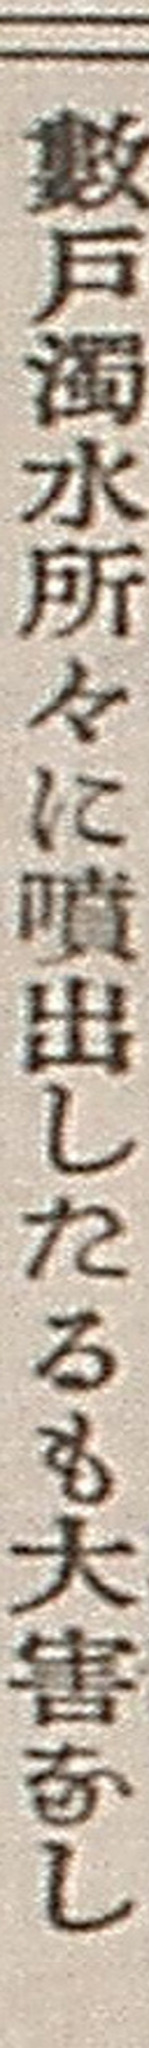数戸濁水所々に噴出したるも大害なし
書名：風俗畫報臨時増刊第百二十四號　洪水地震被害録（上）
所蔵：東京大学地震研究所図書室 Earthquake Research Institute Library, The University of Tokyo, JAPAN
